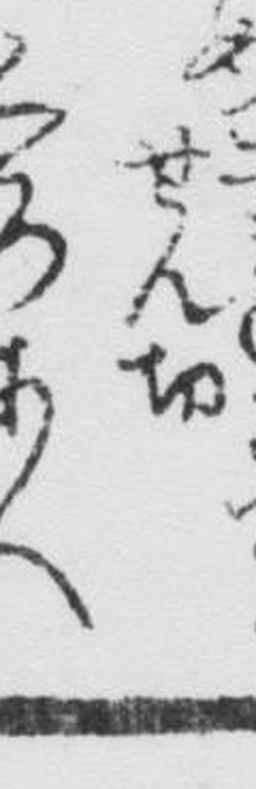くろあへ
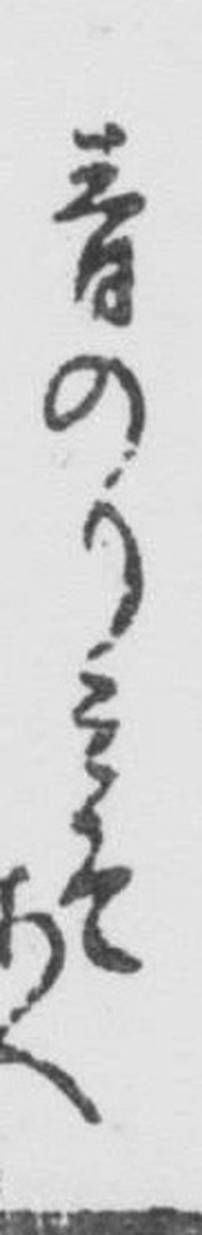青のりみそあへ
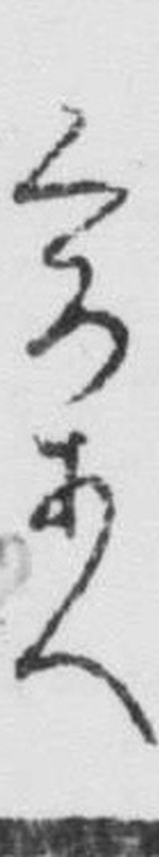くろあへ
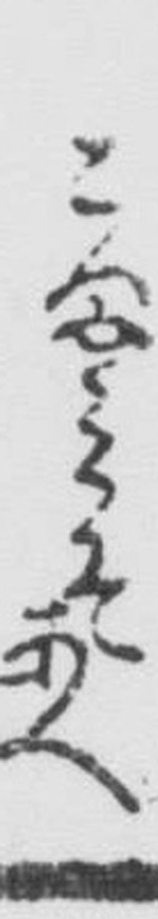こまみそあへ
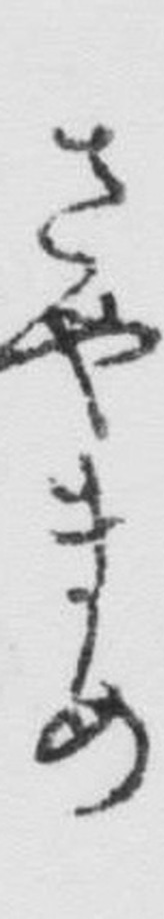さやまめ
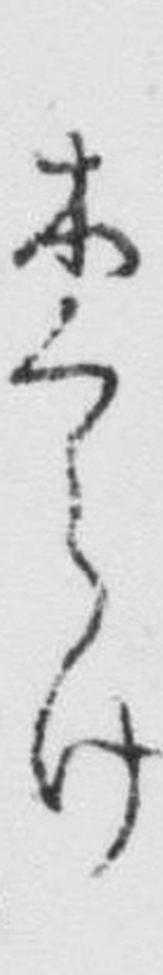木くらけ
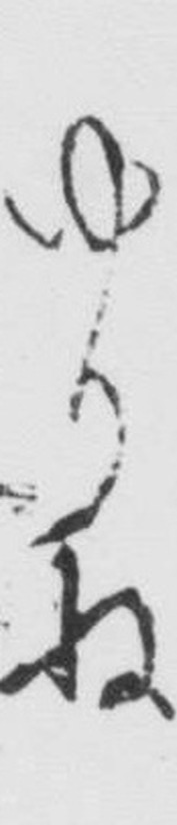ゆりね
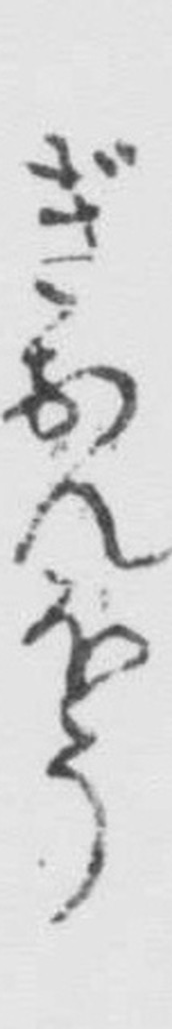ぎおんほう
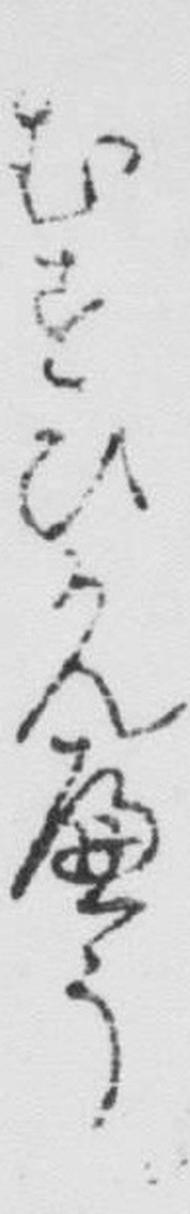むすひかんへう
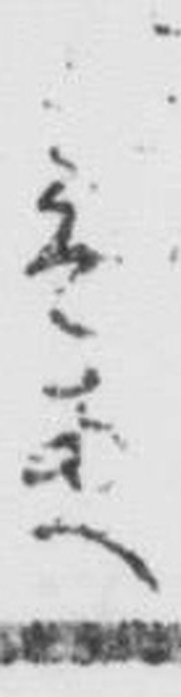みそあへ
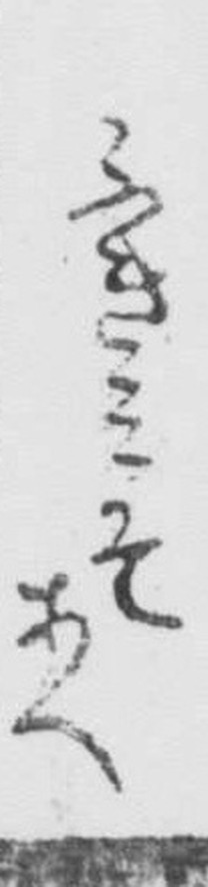ふきみそあへ
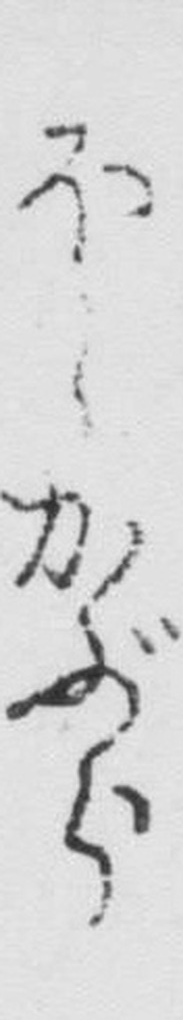ほしかぶら
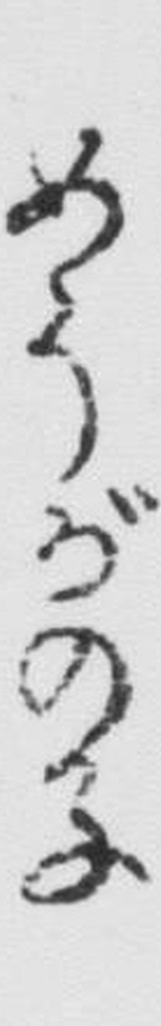めうがの子
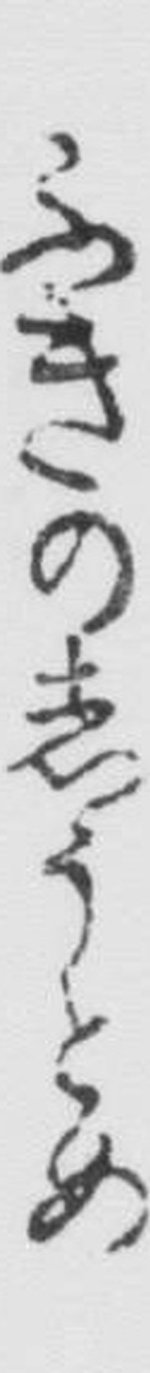ふきのしうとめ
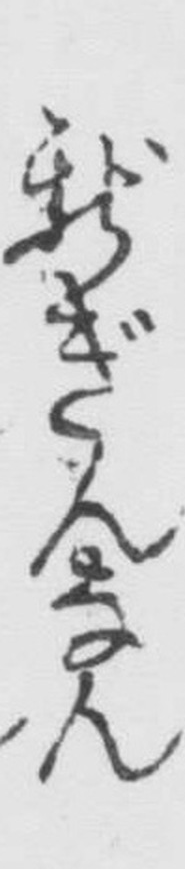新ぎんなん
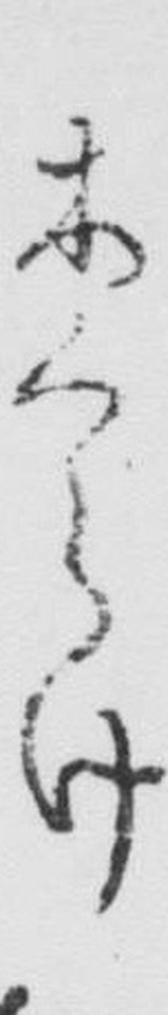木くらけ
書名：諸家通用/即席料理
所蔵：大阪府立大学学術情報センター 国文学研究資料館
